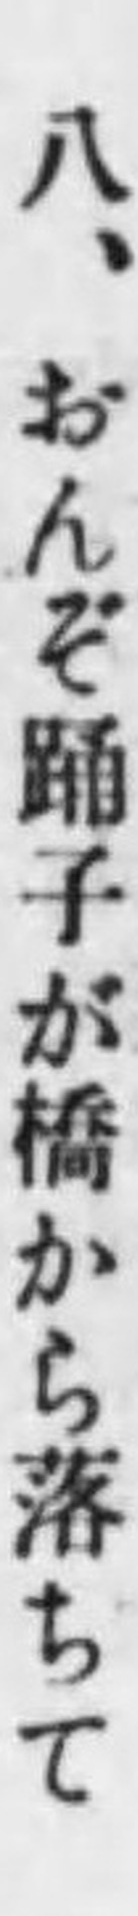八、おんぞ踊子が橋から落ちて
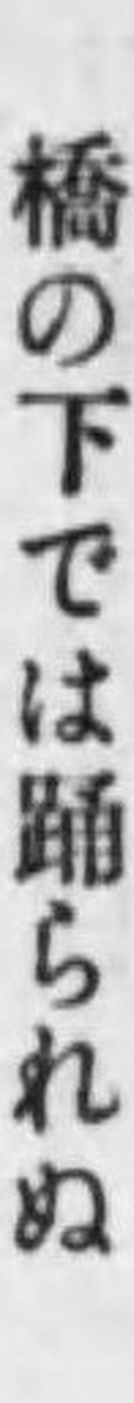橋の下では踊られぬ
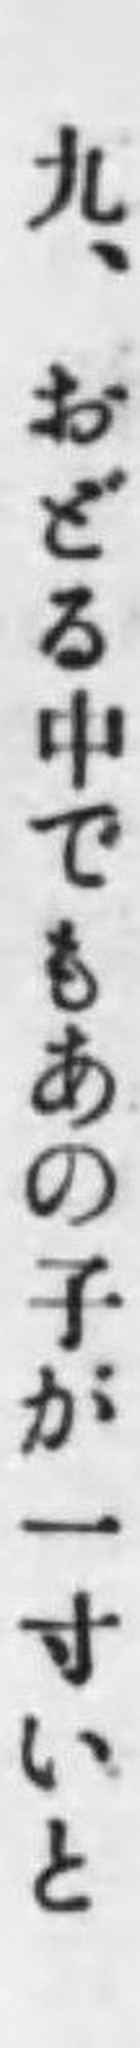九、おどる中でもあの子が一寸いと
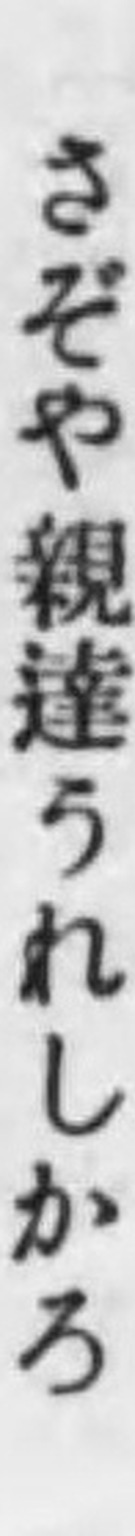さぞや親達うれしかろ
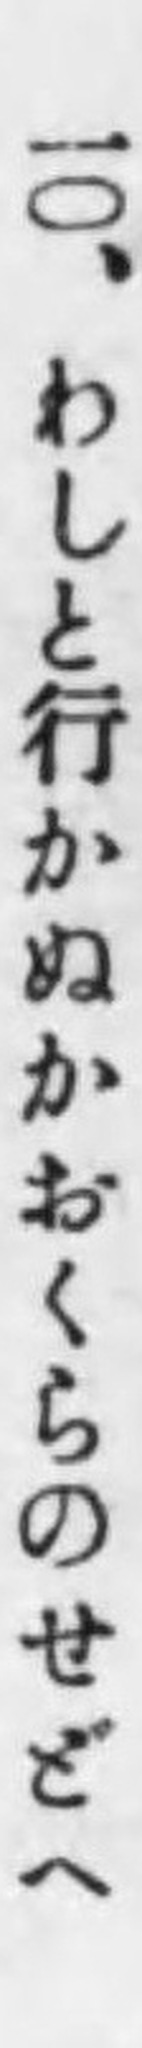一〇、わしと行かぬかおくらのせどへ
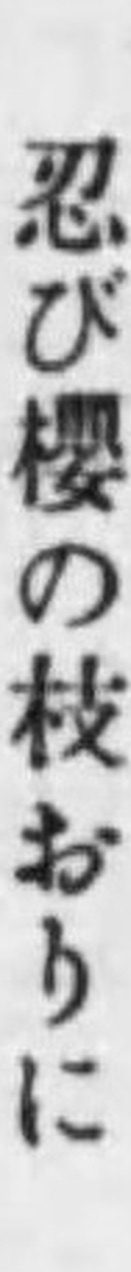忍び櫻の枝おりに
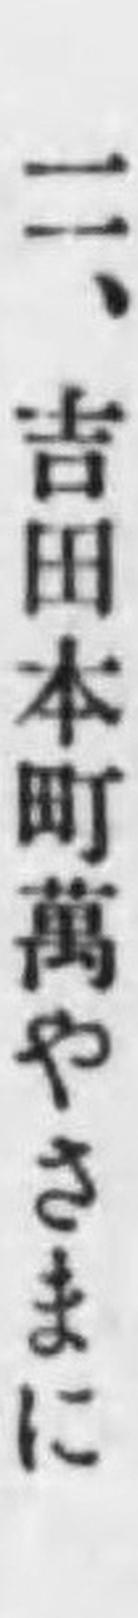一一、吉田本町萬やさまに
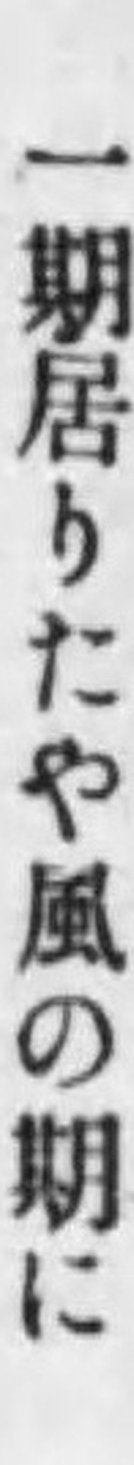一期居りたや風の期に
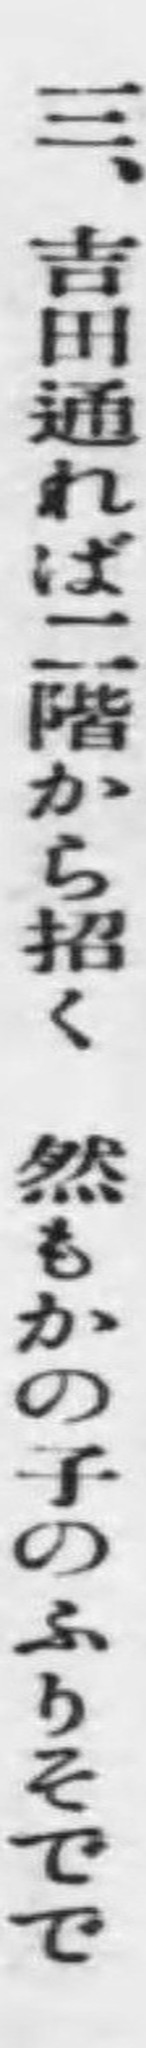一二、吉田通れば二階から招く然もかの子のふりそでで

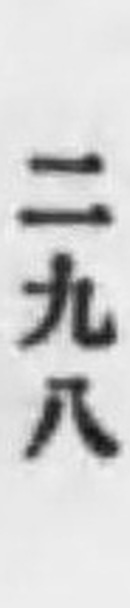二九八
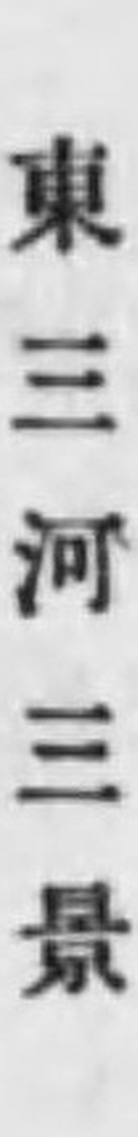東三河三景
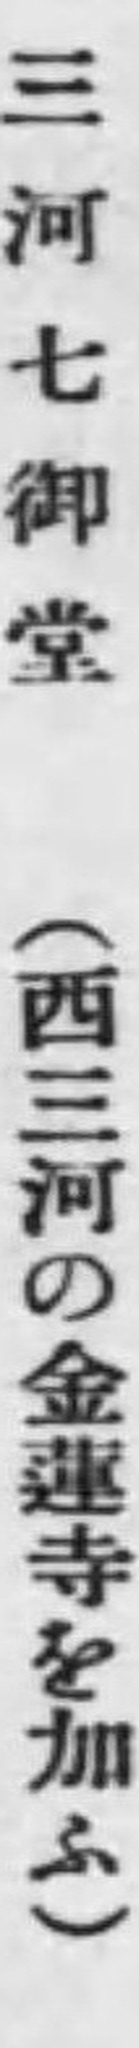三河七御堂(西三河の金蓮寺を加ふ)
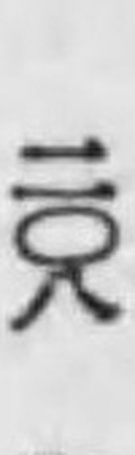二九八
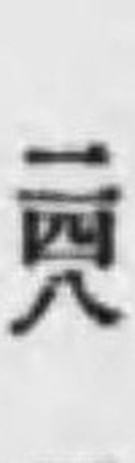二九八
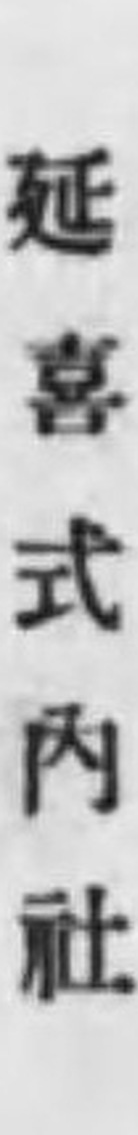延喜式内社
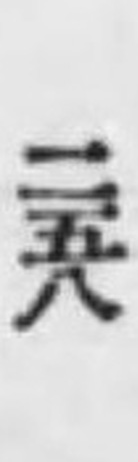二九八
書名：東三河道中記 : 豊橋市及其附近案内
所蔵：国立国会図書館 National Diet Library, JAPAN
